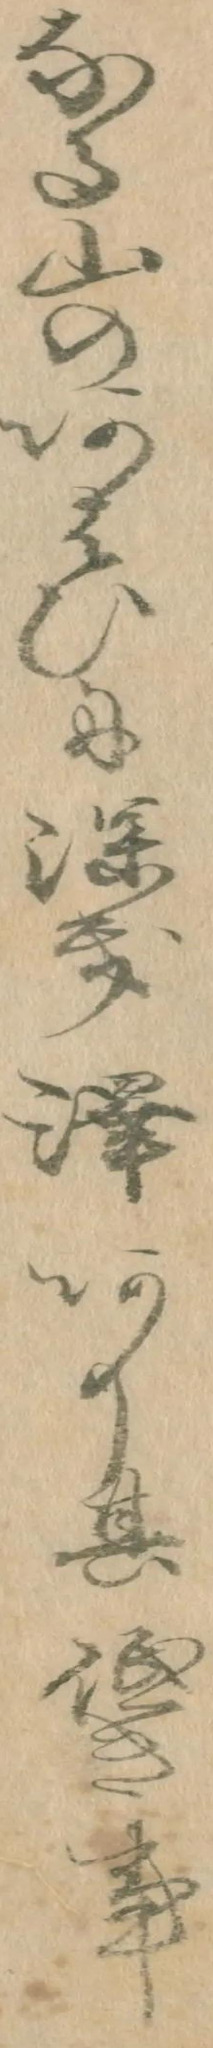なる山のあはひに深き沢あり其低き事
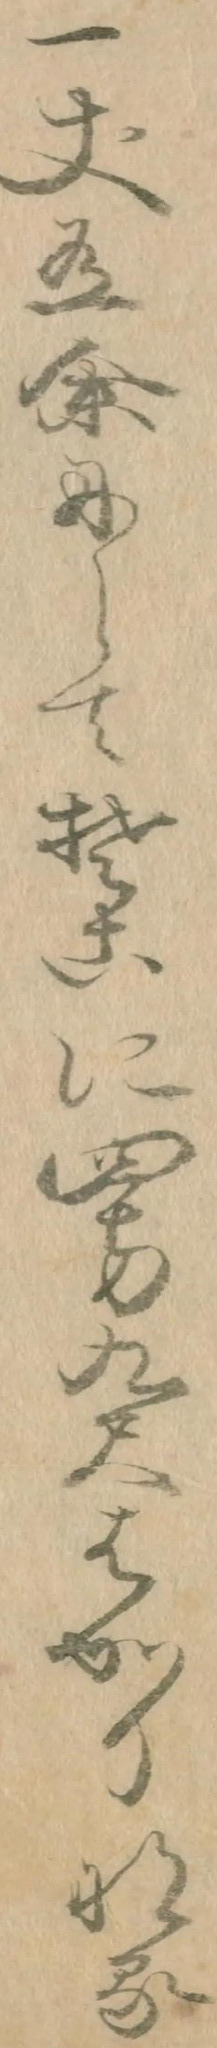一丈有余にしてそこに四方九尺はかりなる
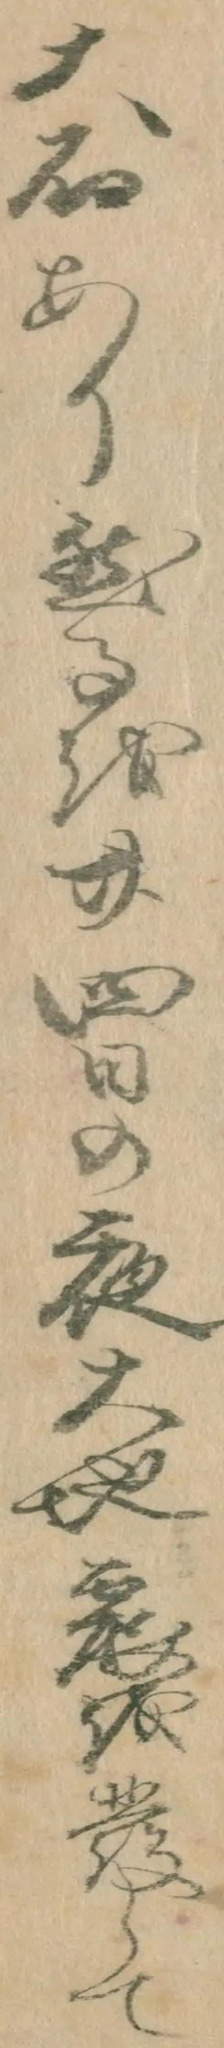大石あり然るを廿四日の夜大地震発して
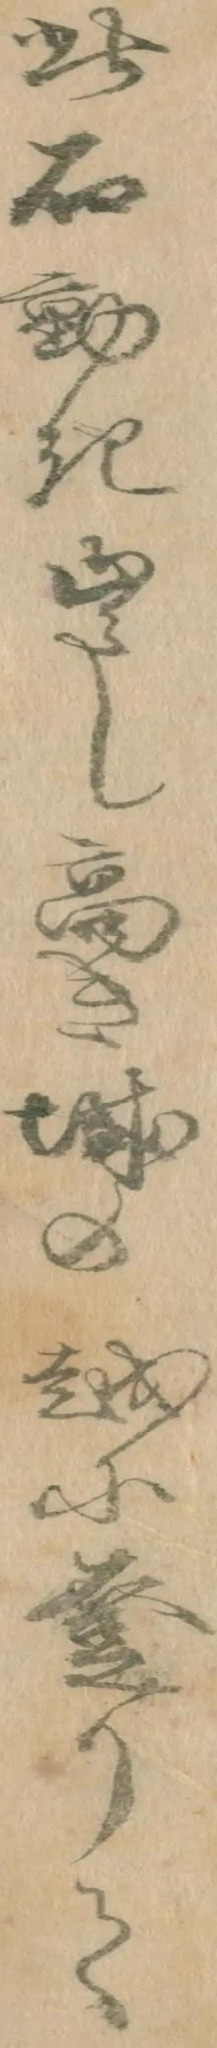此石動き出し高き城の越に登りて
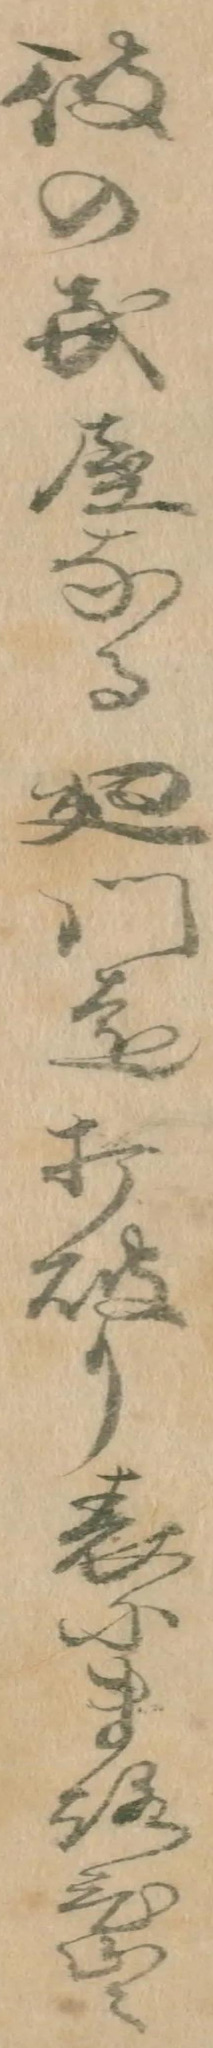彼の民屋なる廻門を打破り表にまろひ出
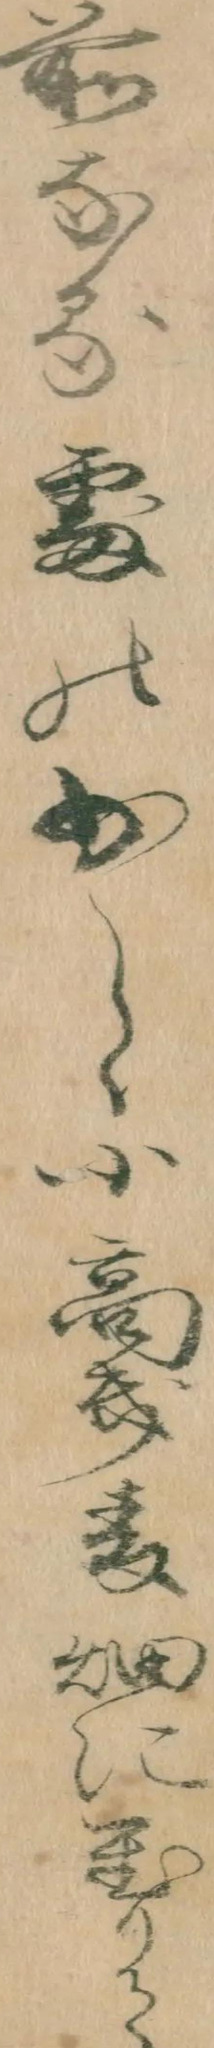前なる処の少しく小高き麦畑に至りて
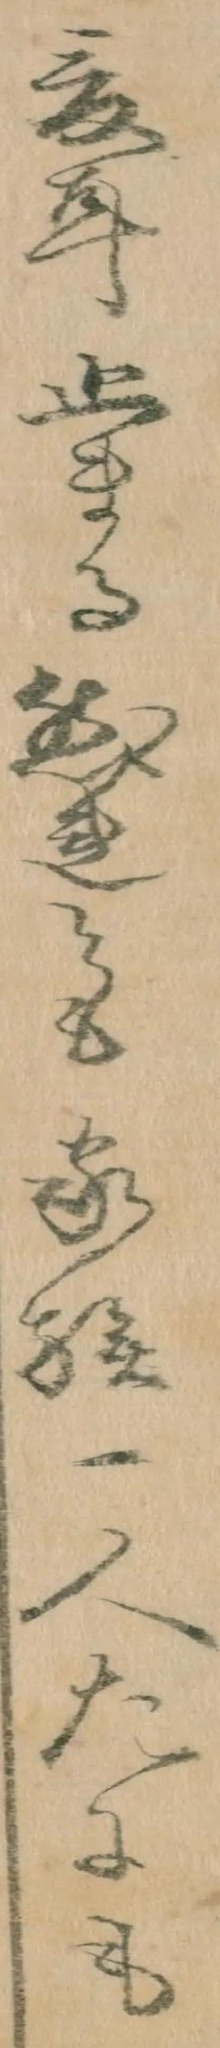爰に止まる然れとも家族一人たにも
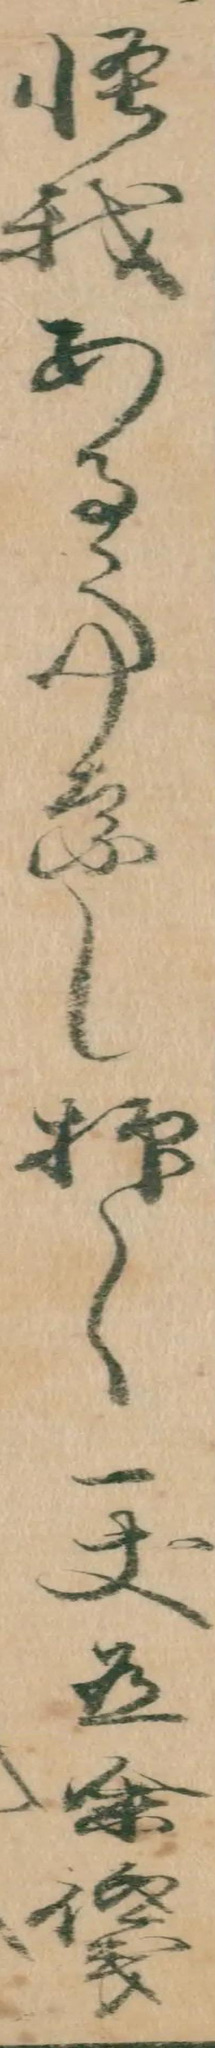怪我ある事なし抑〳〵一丈有余低き
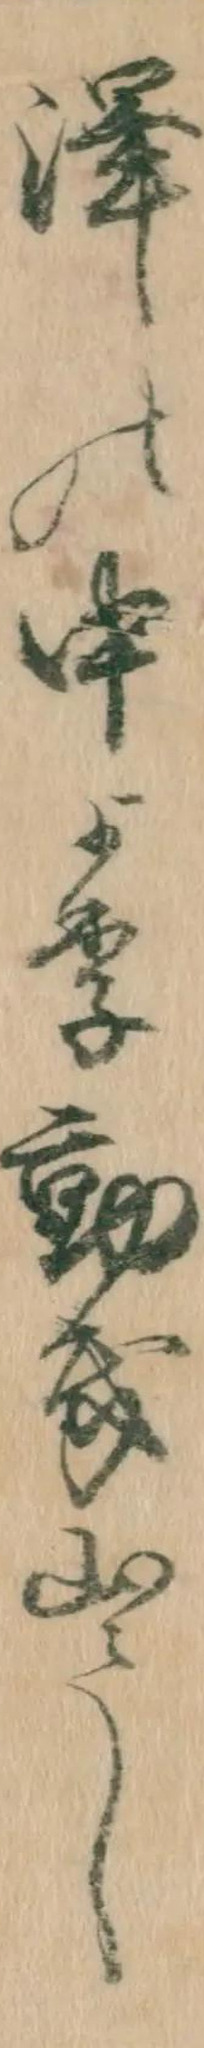沢の中より動き出し
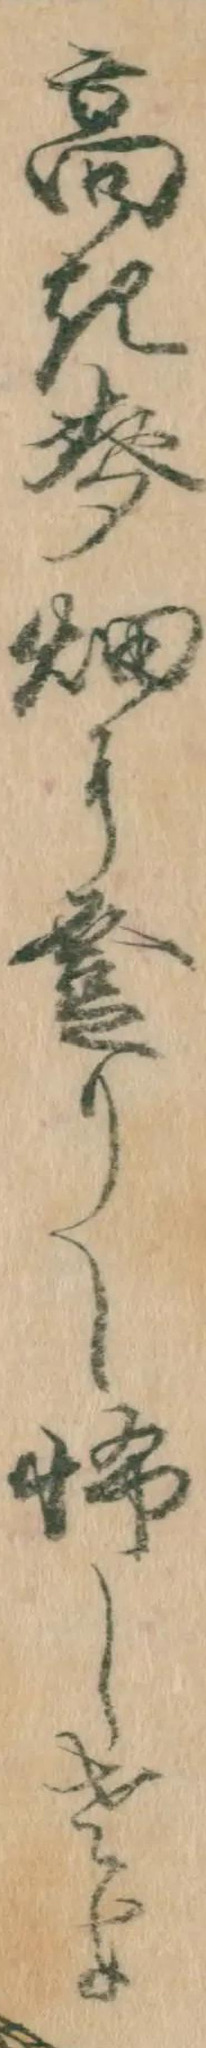高き麦畑に登りし怖しさよ
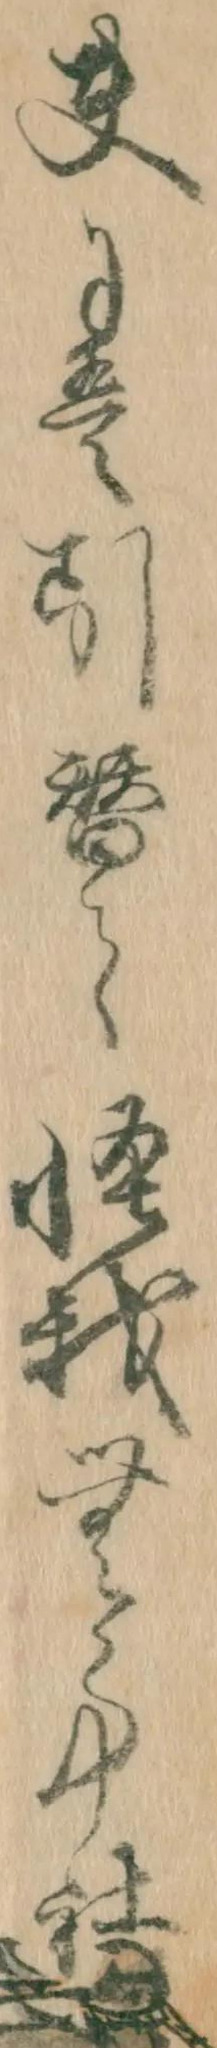夫には引替て怪我無事社
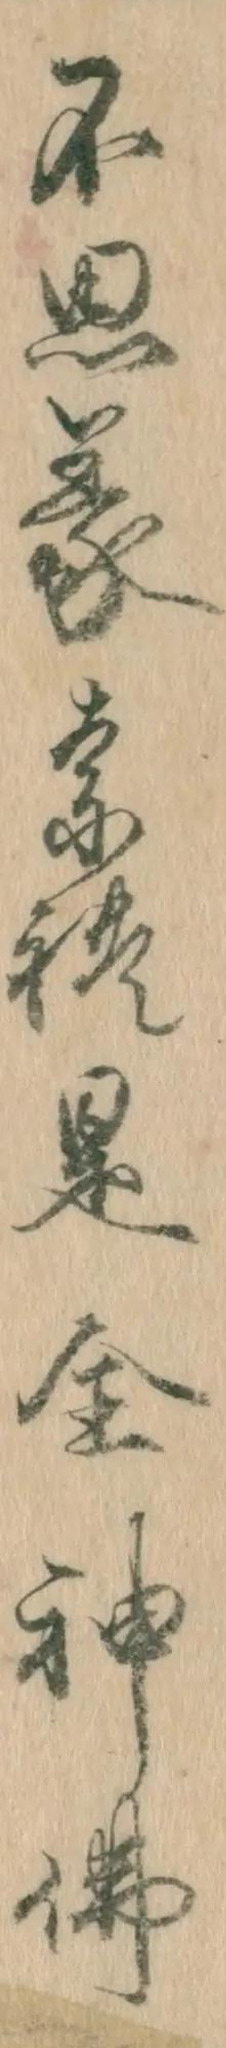不思義なれ是全神仏
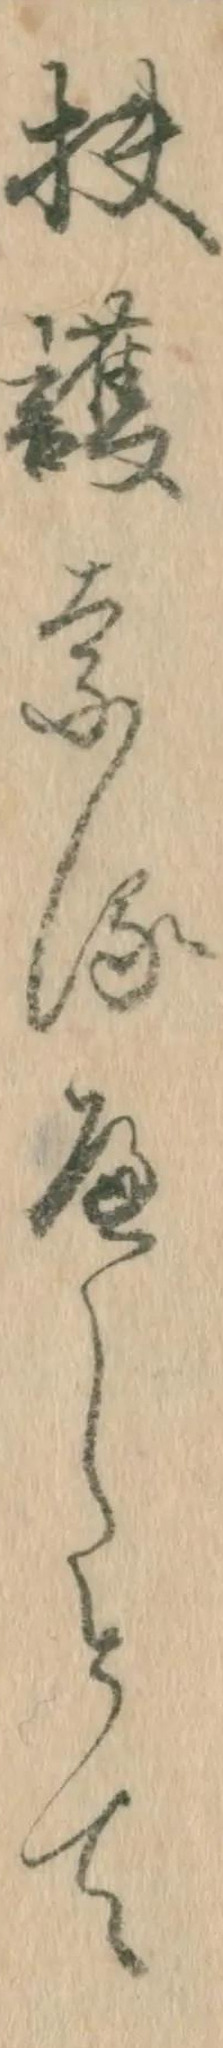扶護なるへしとて
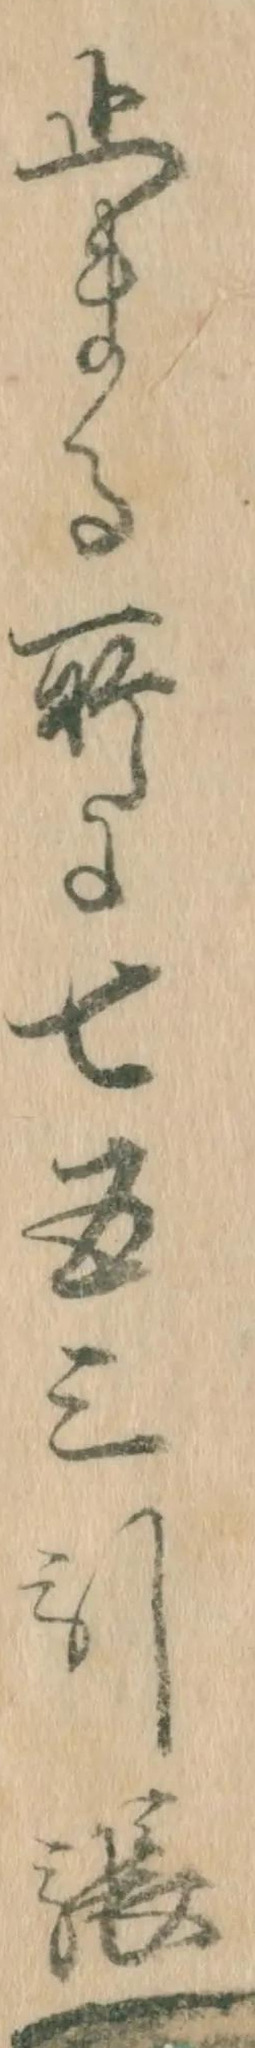止まる所に七五三引張
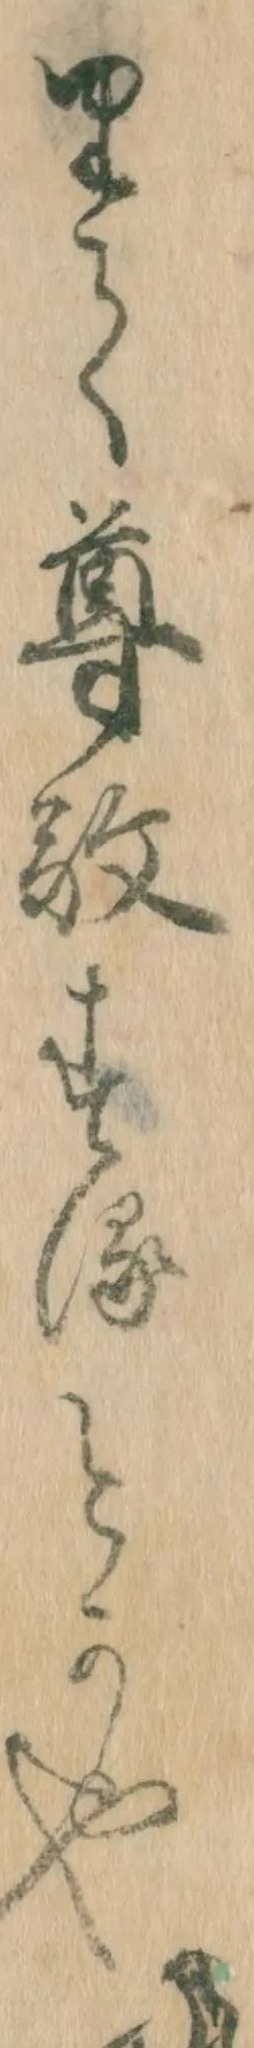りて尊敬するとかや
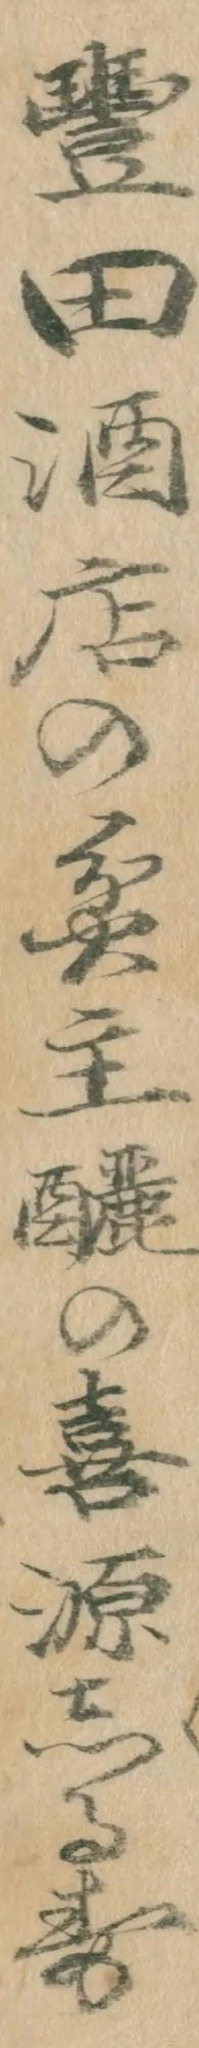豊田酒店の貧主釃の喜源しるす
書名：俗語之種. [6]
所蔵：国立国会図書館 National Diet Library, JAPAN
